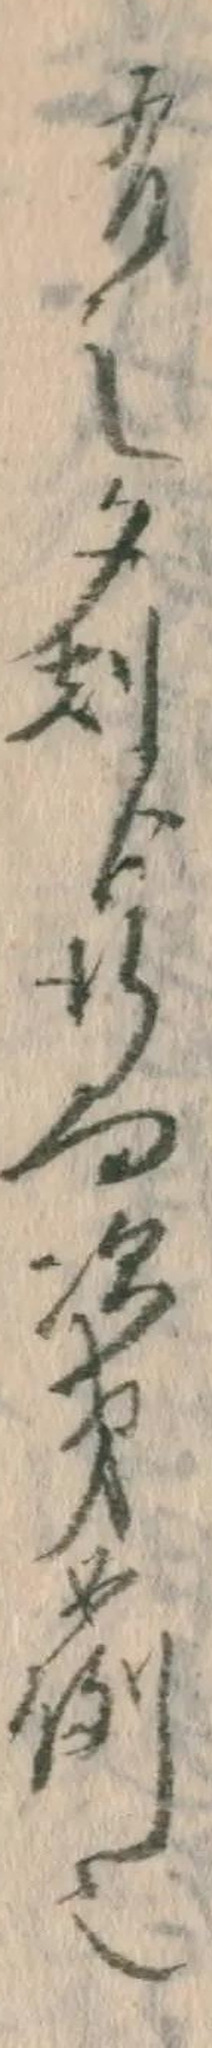有之夕刻ゟ行向次第如例也
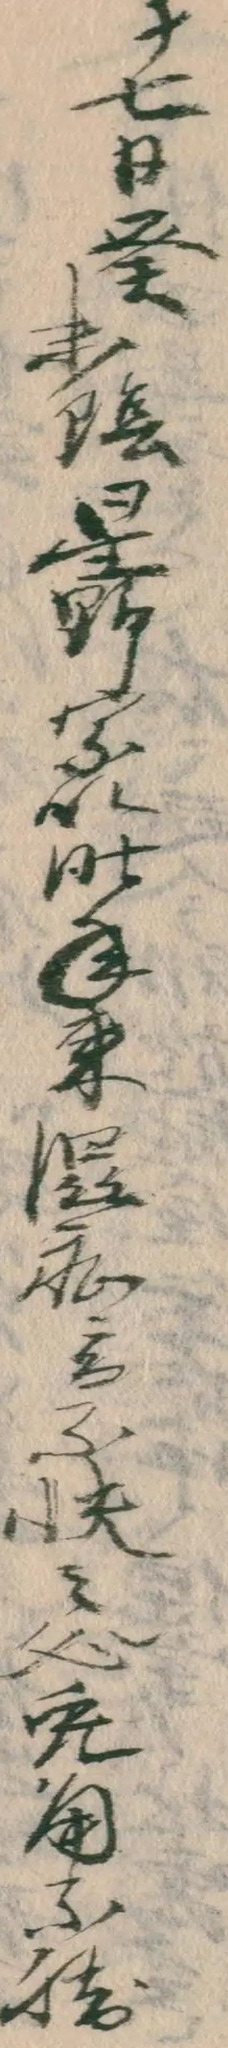十七日癸卯曇り星野家以昨年来湿気ニ而不快之処兎角不勝
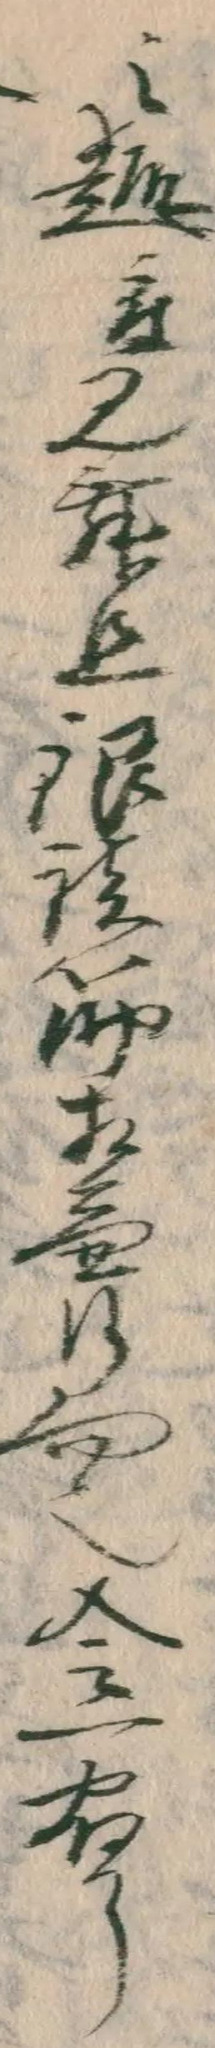之趣ニ付見舞且銀談筋相兼行向也今一宿了
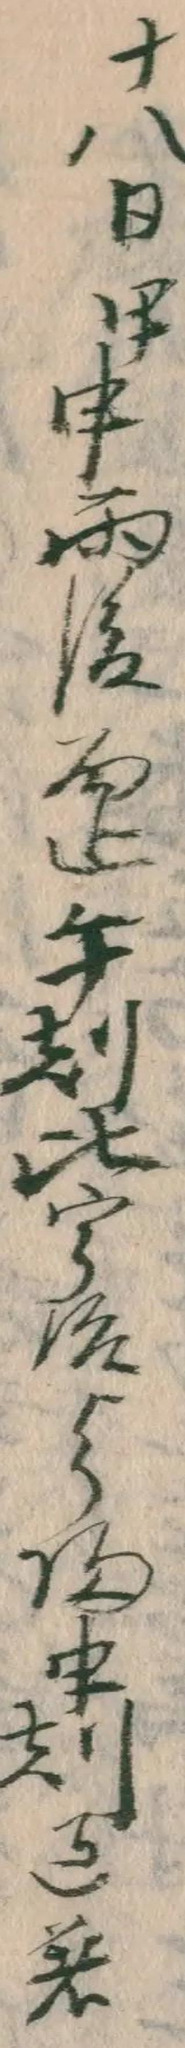十八日甲申雨後雨止午刻比宇治より帰申刻過着
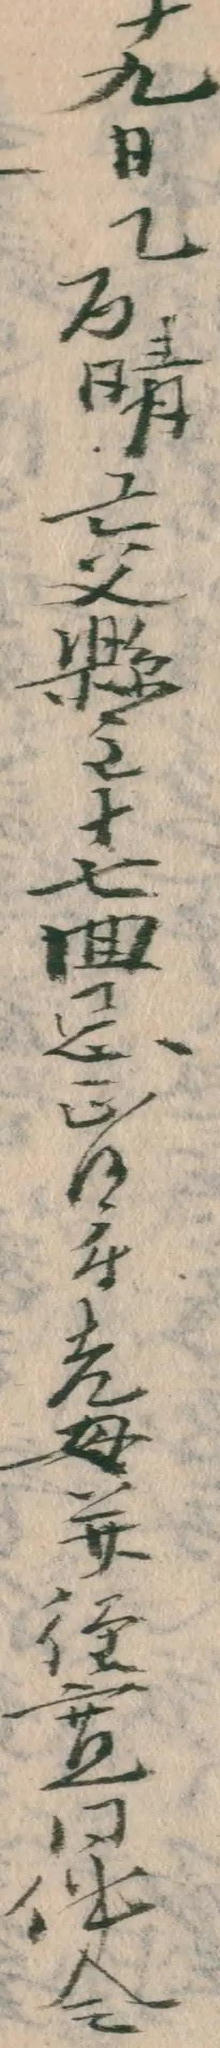十九日乙酉晴亡父縣主十七回忌正月ニ付老母并経寛同伴令
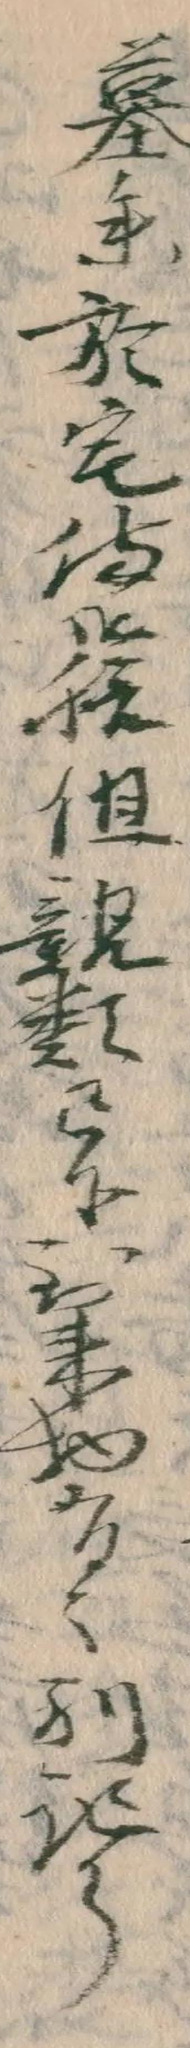墓参於宅備御膳但親類已下到来物有之別記了
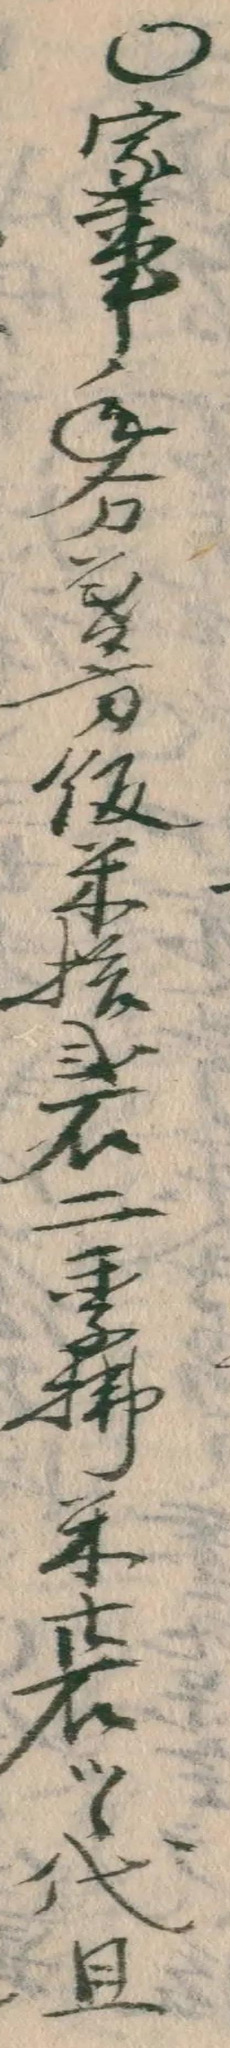○家事年分着方仮米拾弐石二季拂米廿石ツヽ代且
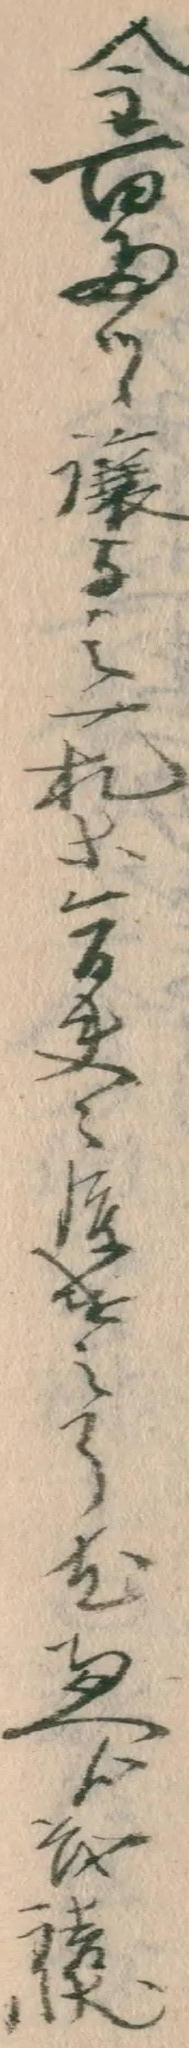金百両ツヽ譲与之一札等今日夫々渡遣之了尤両人ゟも請状
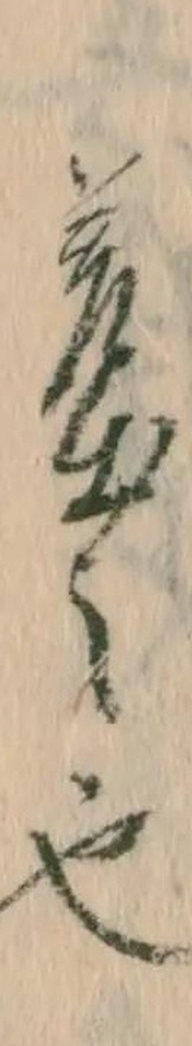差出之也
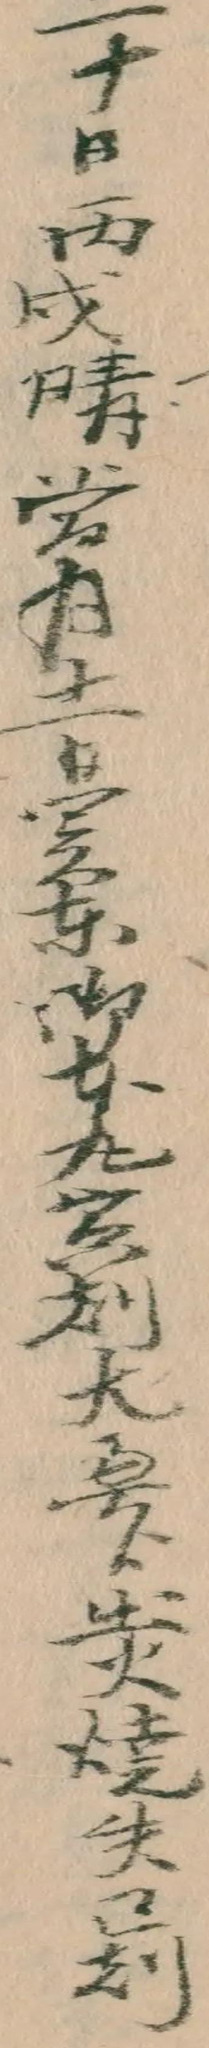二十日丙戌晴當月十一日関東御本丸寅刻大奥ゟ出火焼失巳刻
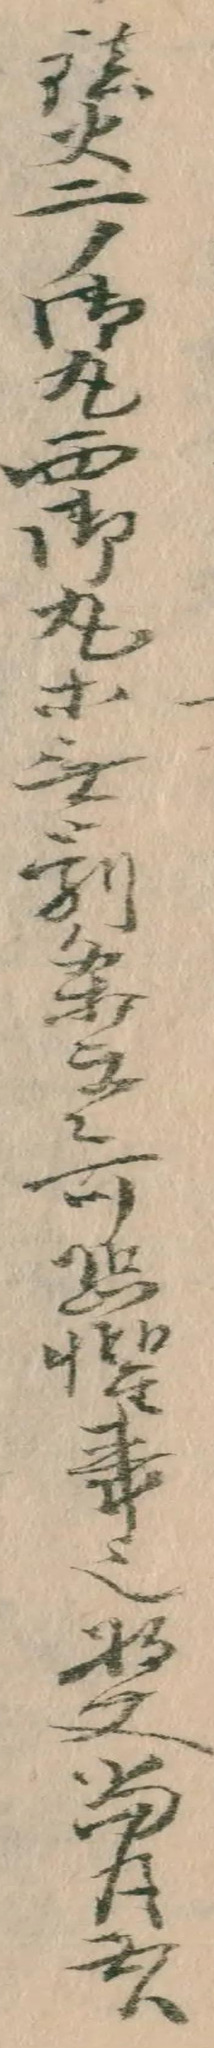鎮火二ノ御丸西御丸等無御別条云々可恐懼事也将又當月五日
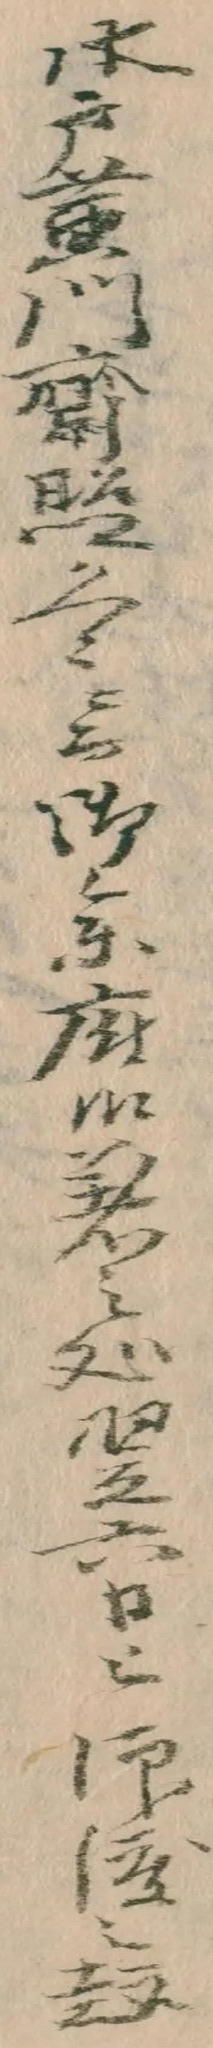水戸黄門齊昭卿答ニ而御参府御奥之処翌六日被仰渡之趣
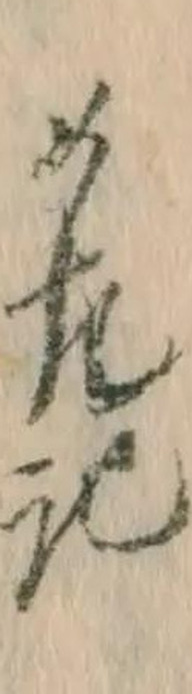如左記
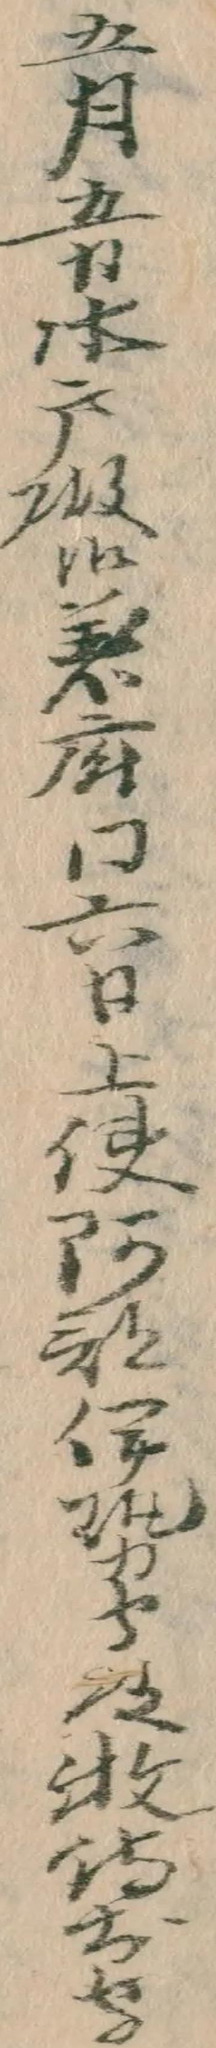五月五日水戸殿御着府同六日上使阿部伊勢守殿牧備前守
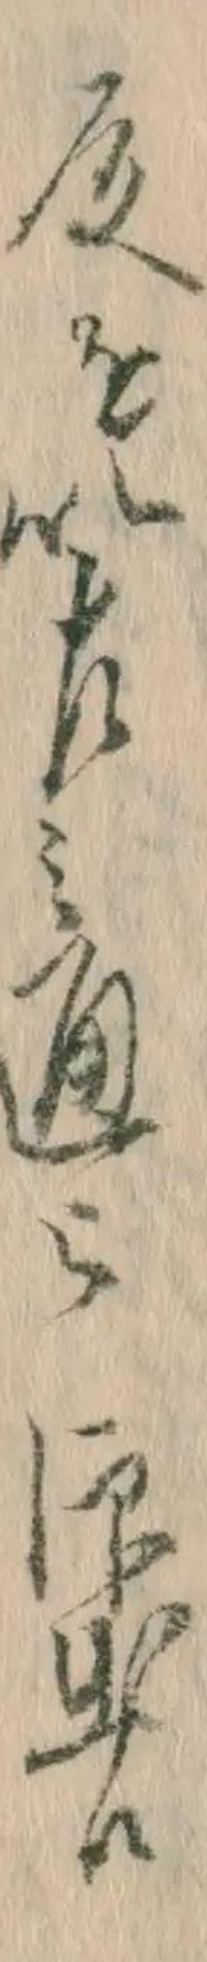殿を以左之通被仰出候
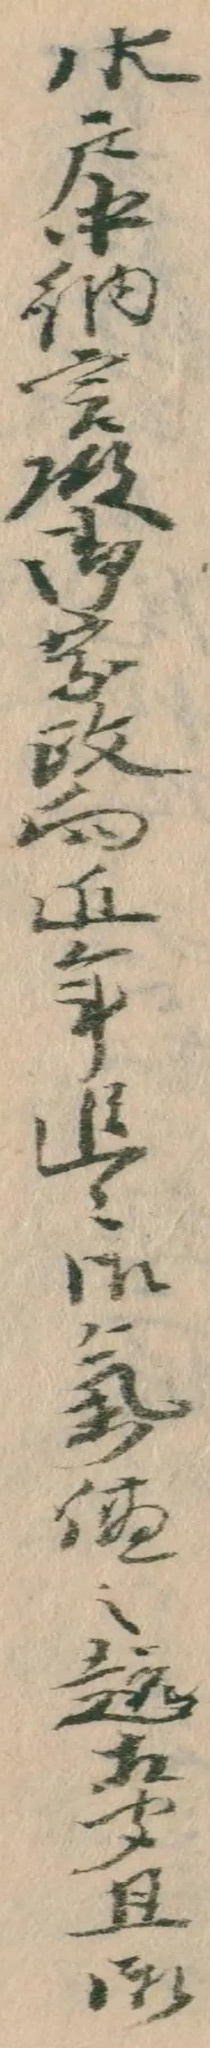水戸中納言殿御家政向正年追々御氣極之趣相聞且御
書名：賀茂社記録. 第69冊
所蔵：国立国会図書館 National Diet Library, JAPAN
